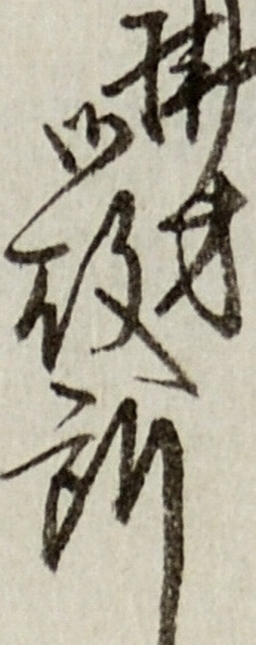御役所
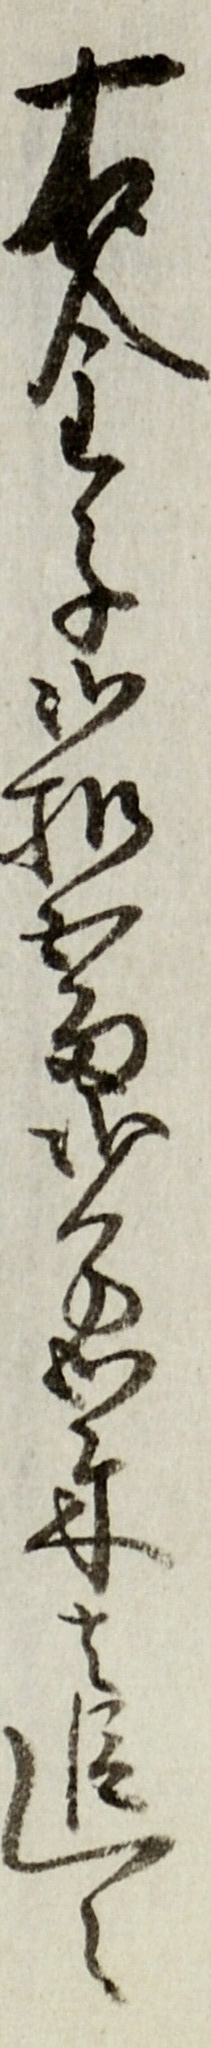右金子弐拾五両弐分弐朱者追々
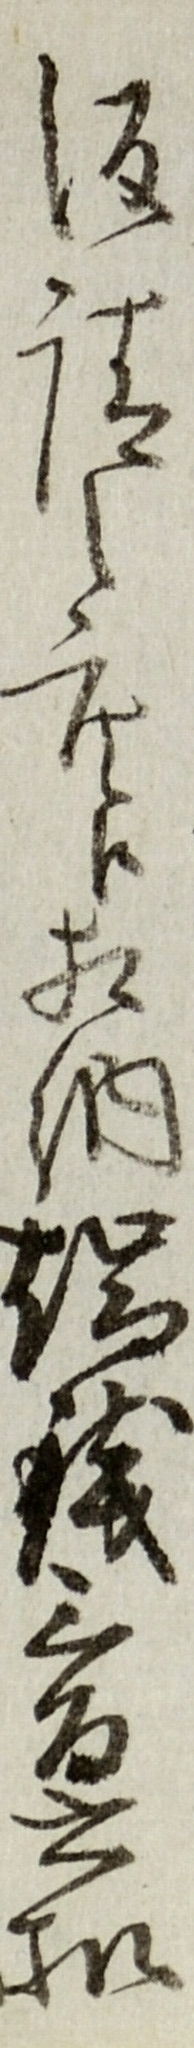仮請之座江相納端銭三百六拾
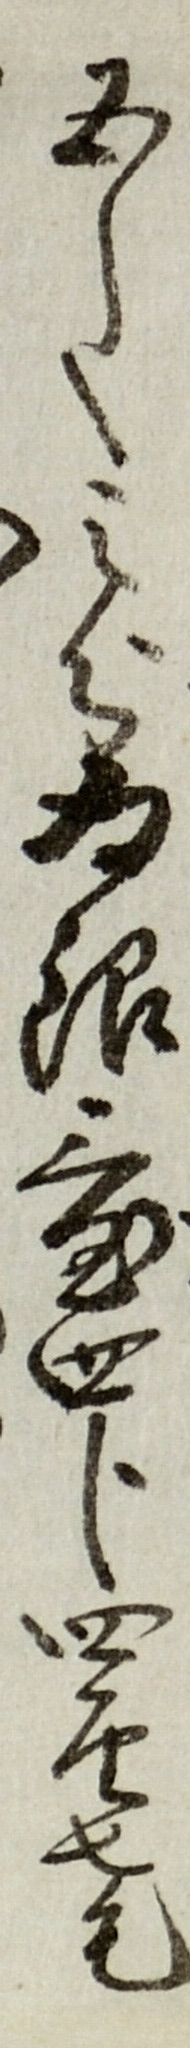五文之分為銀三匁四歩四厘七毛
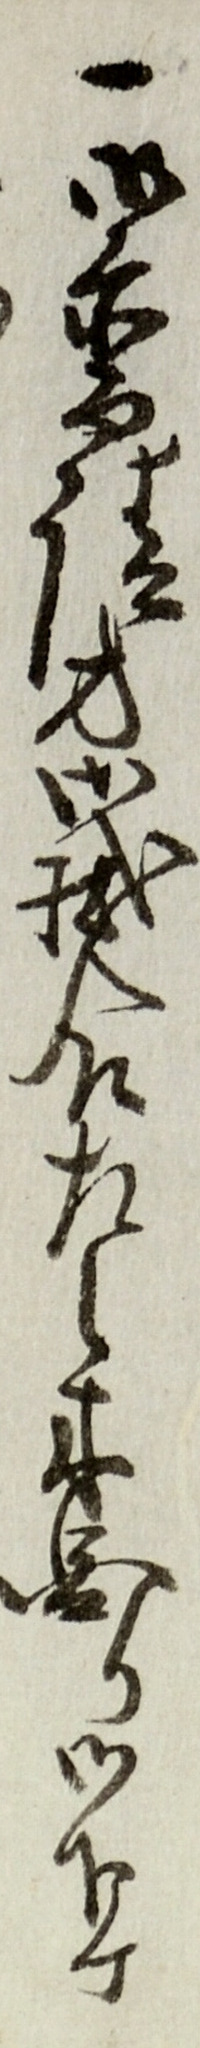一御普請方御掛合左之木図り御下ケ
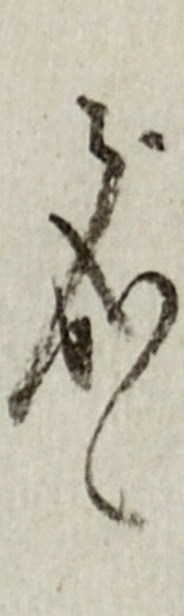被成候
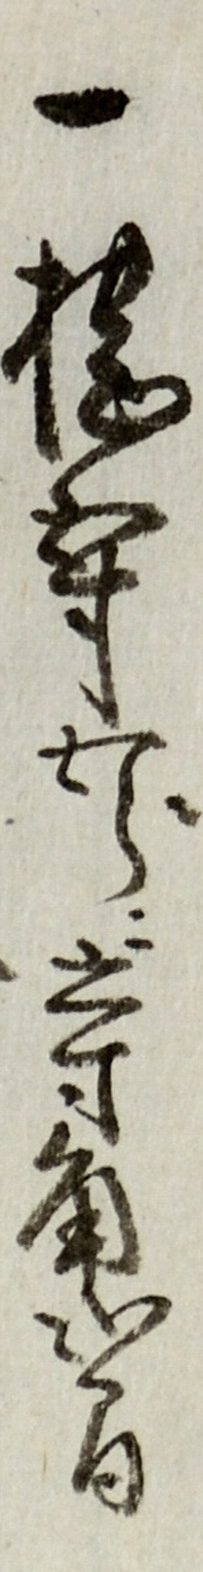一椹五寸五分ニ六寸角弐間八丁
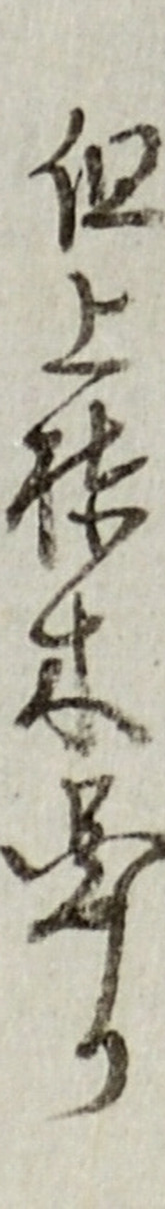但上棟木図り
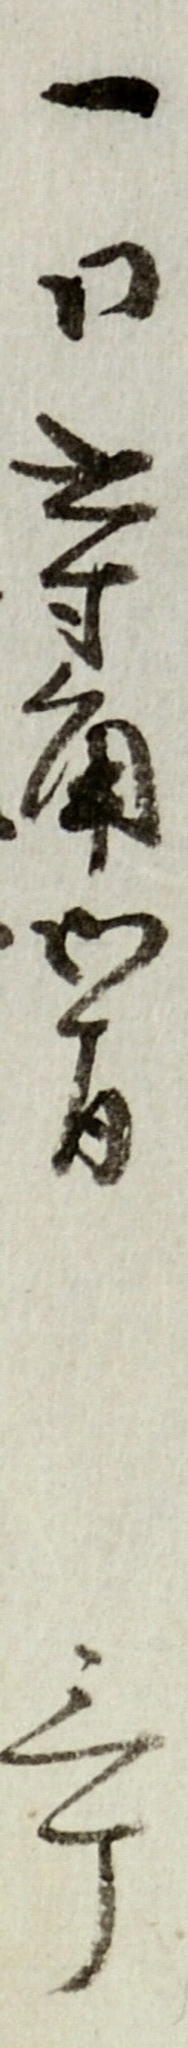一同六寸角弐間三丁
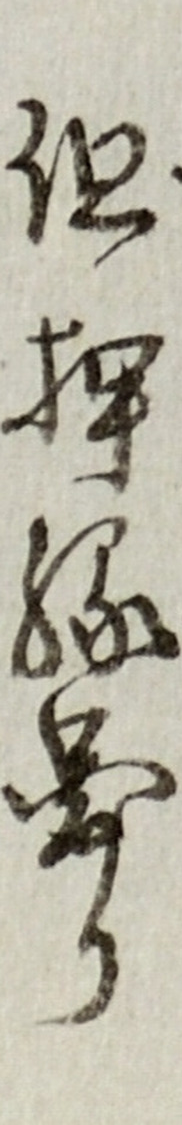但押縁図り
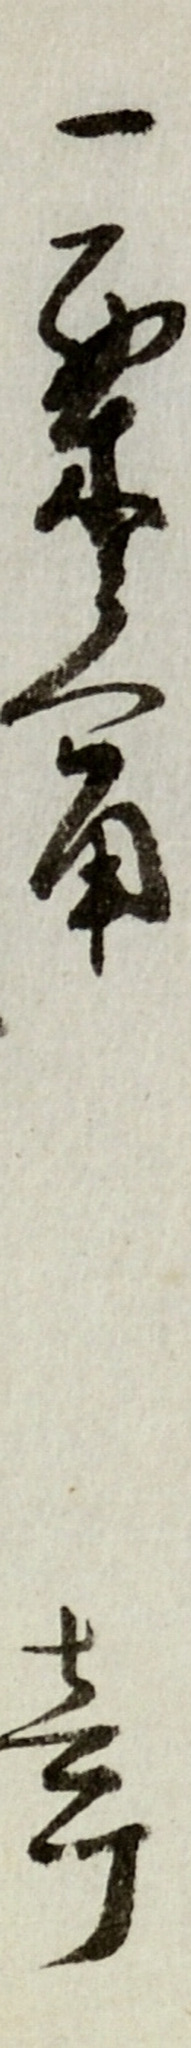一栗尺角壱丁
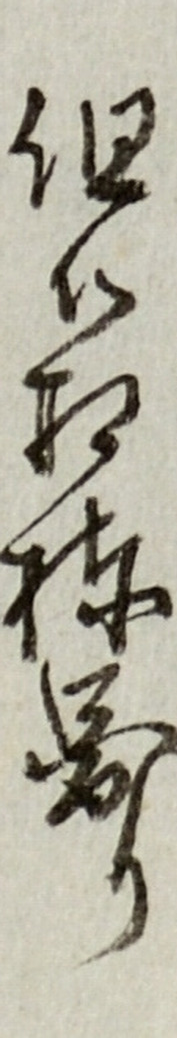但御棟図り
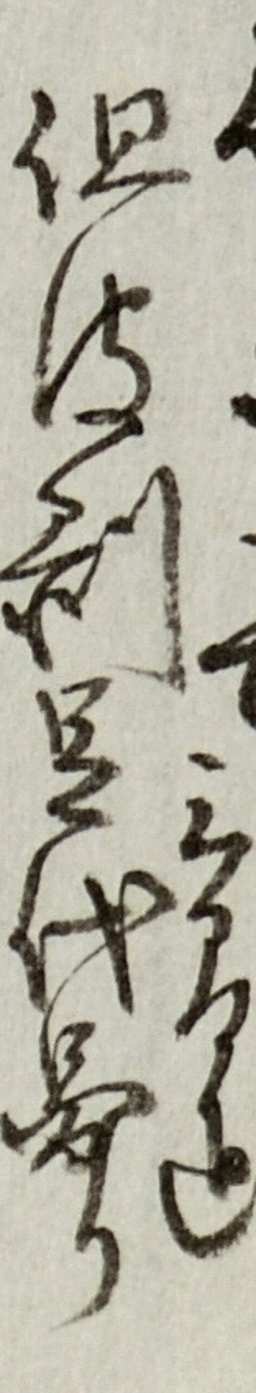但皮剝足代図り
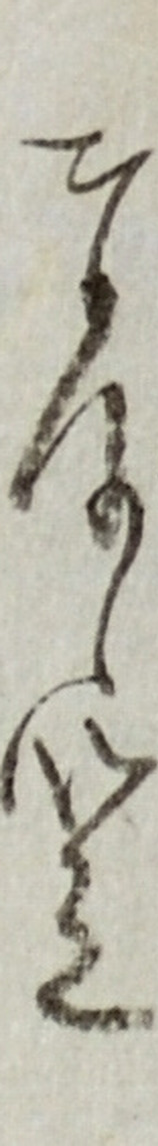奉存候以上
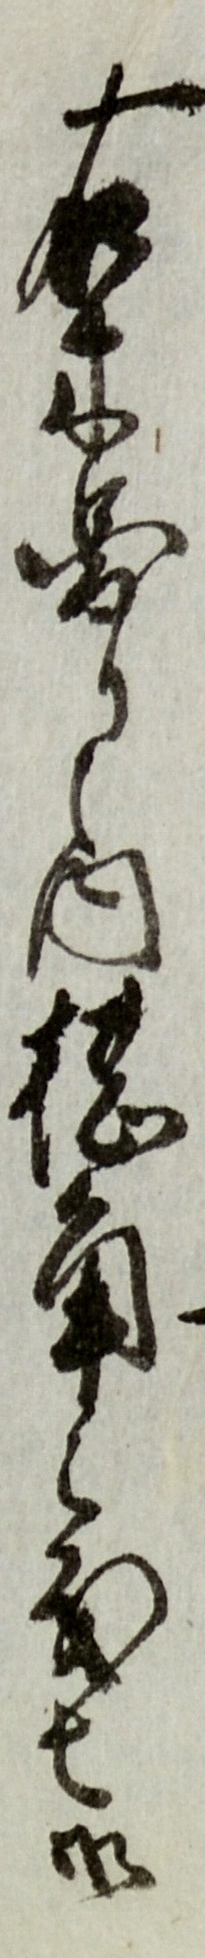右木図り之内椹角之義者御

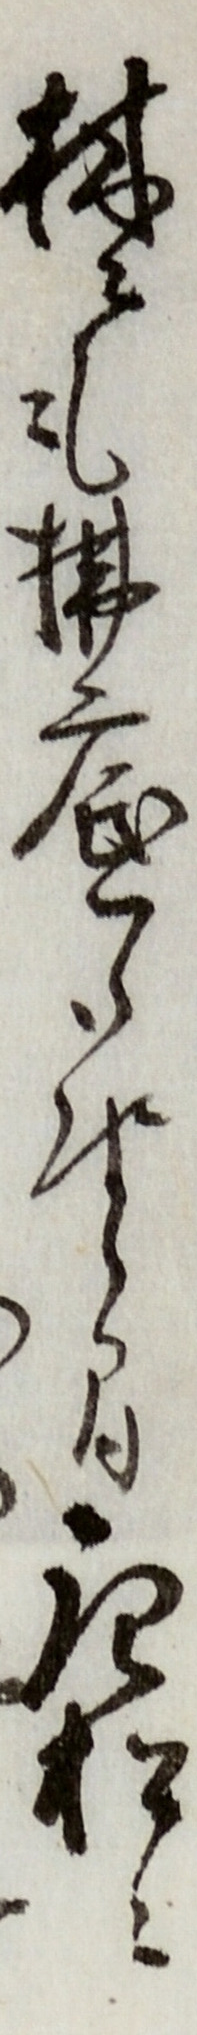林ニも払底御座候間唐松ニ
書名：御山方御薪方諸事御用留
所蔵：伊那市立高遠町図書館・合同会社AMANE
